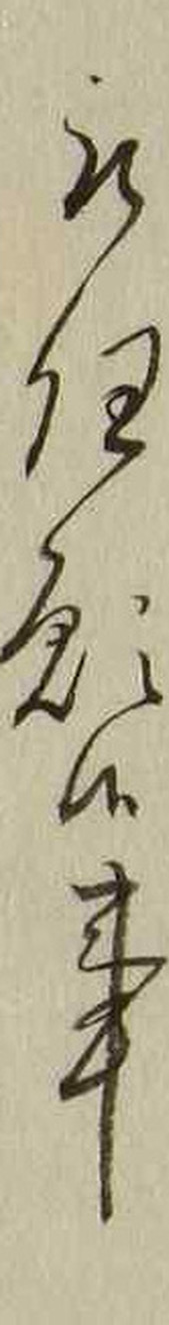被任願候事
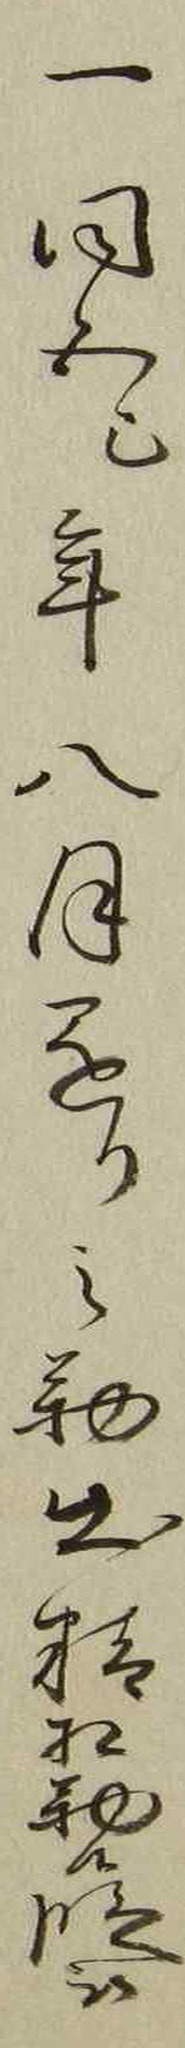一同五巳年八月懸り之勤出精相勤候段被
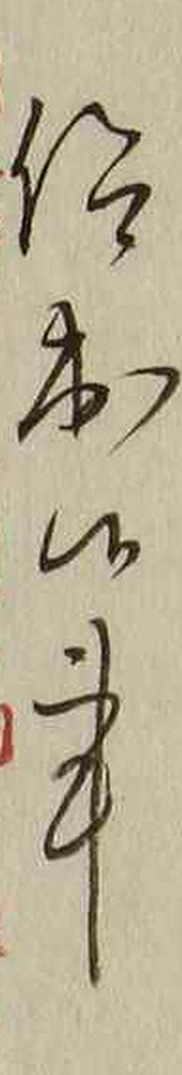仰出候事
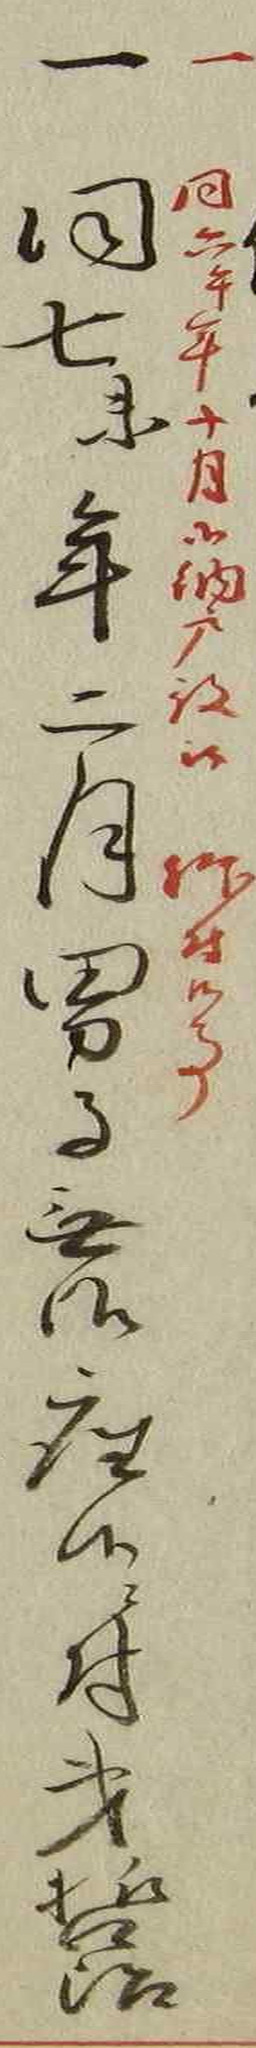一同七未年二月男子無御座候ニ付弟哲治
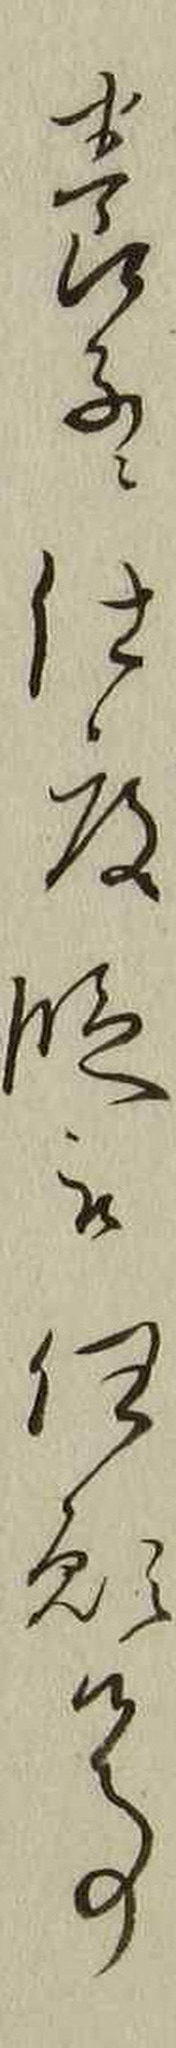養子ニ仕度段被任願候事
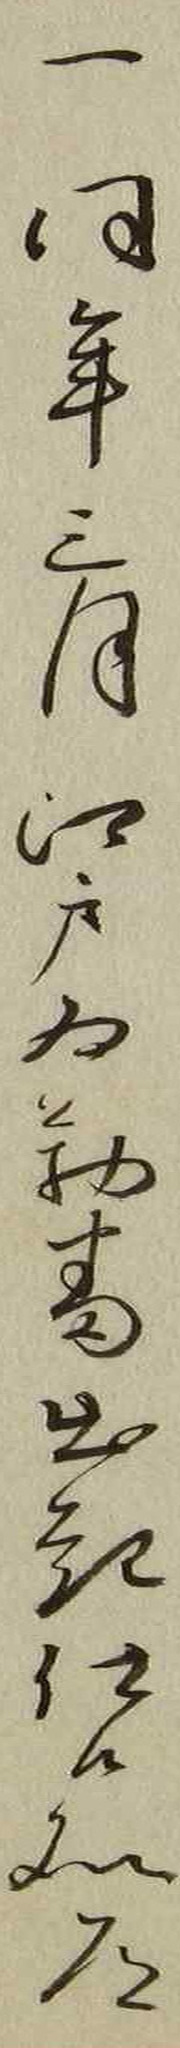一同年三月江戸為勤番出起仕候処道
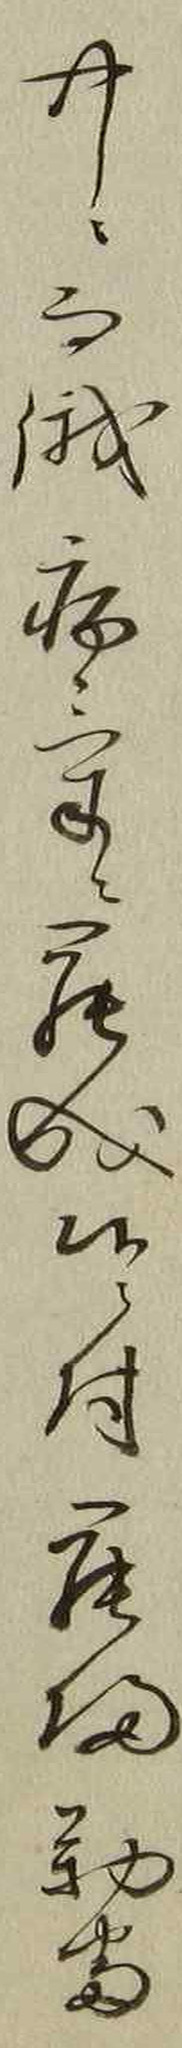中ニ而俄病気ニ罷成候ニ付罷帰勤番
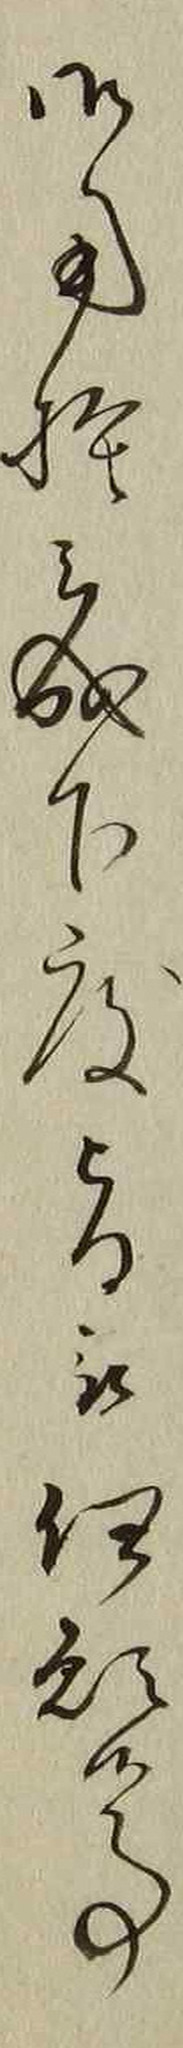御用捨被成下度旨被任願候事
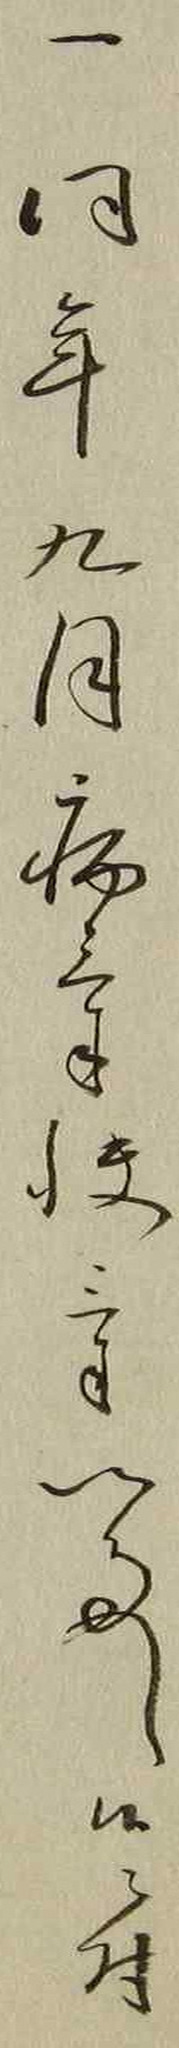一同年九月病気快気いたし候ニ付
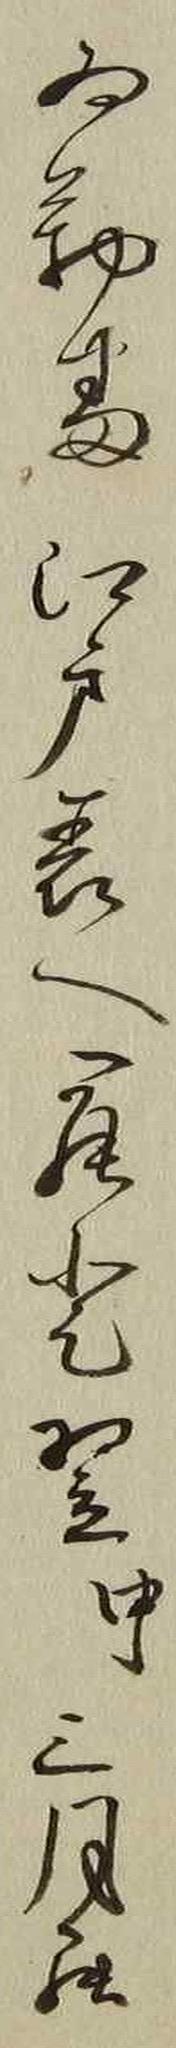為勤番江戸表へ罷登翌申三月罷
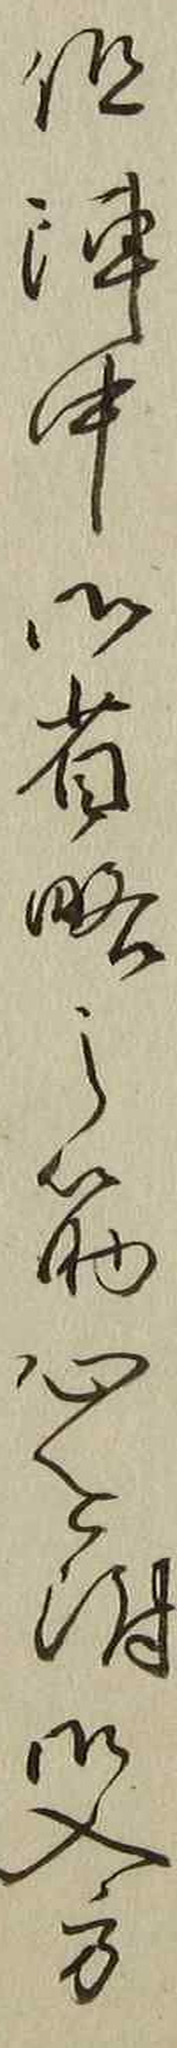但陣中御省略之筋心を附御入方
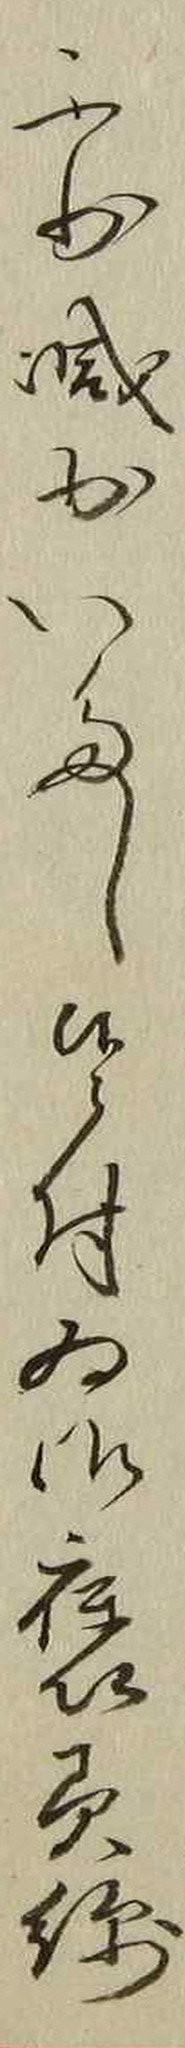不少減少いたし候ニ付為御褒美綿
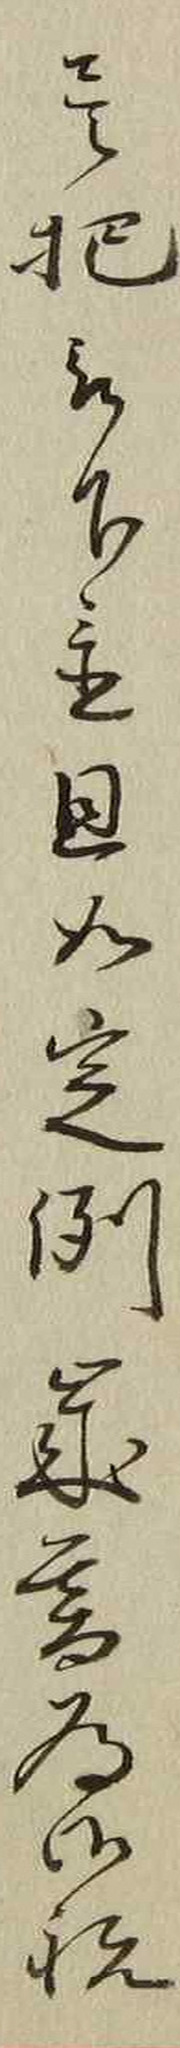壱把被下置且如定例歳暮為御祝
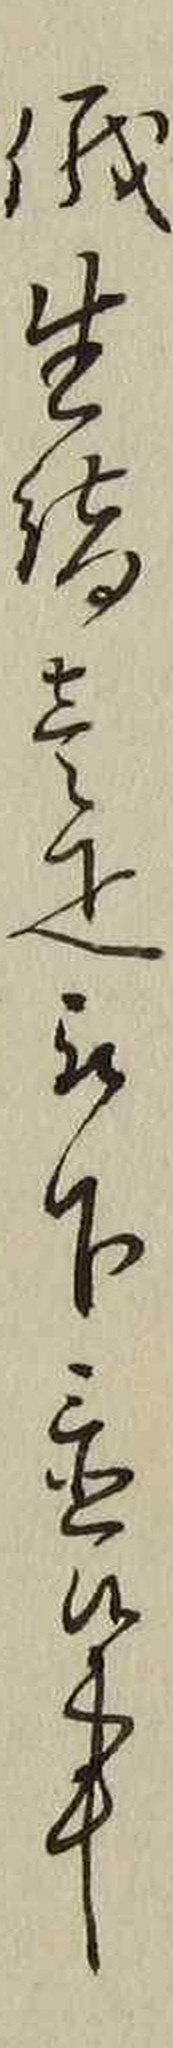儀生絹壱疋被下置候事
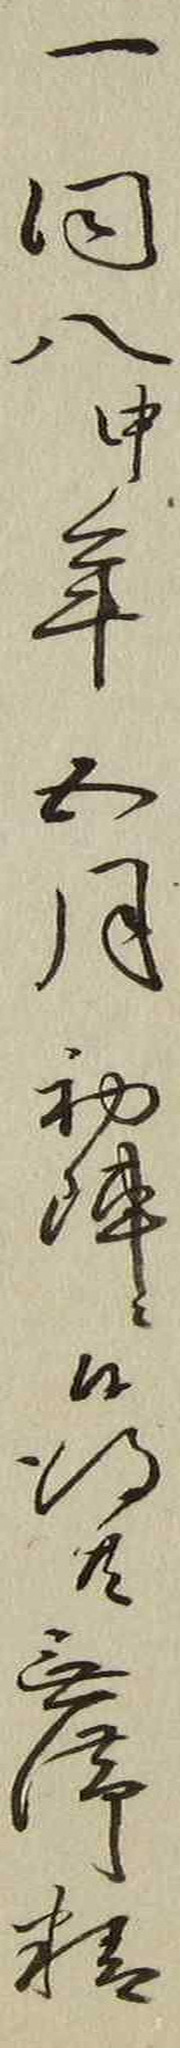一同八申年五月初陣ニ候得共無滞精
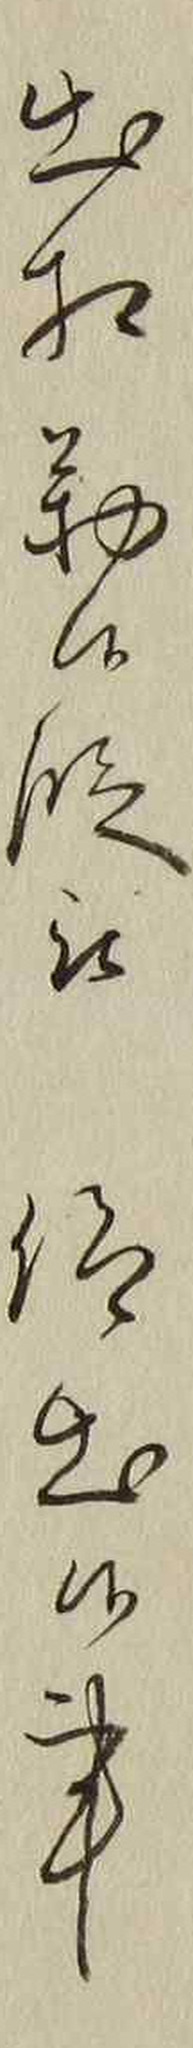出相勤候段被仰出候事
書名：諸士系譜　巻之3　い之部3
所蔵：会津若松市立会津図書館
